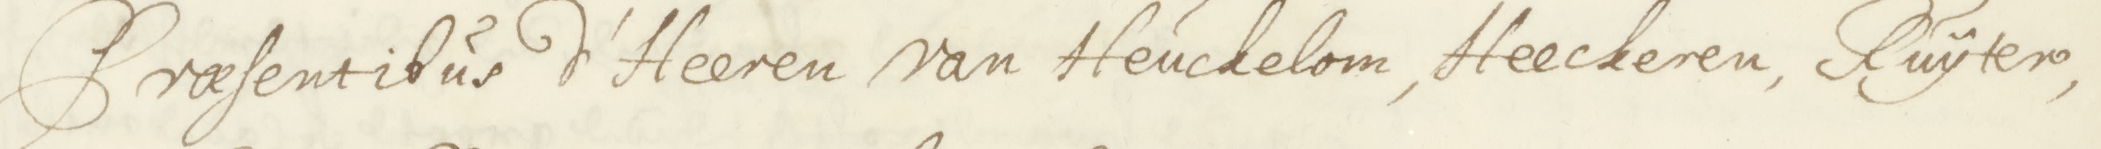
Præsentibus d'Heeren van Heuckelom, Heeckeren, Ruijter,
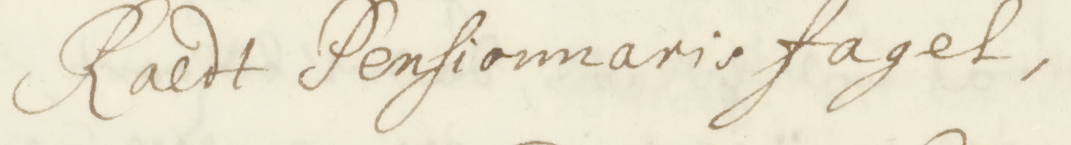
Raedt Pensionnaris Fagel,
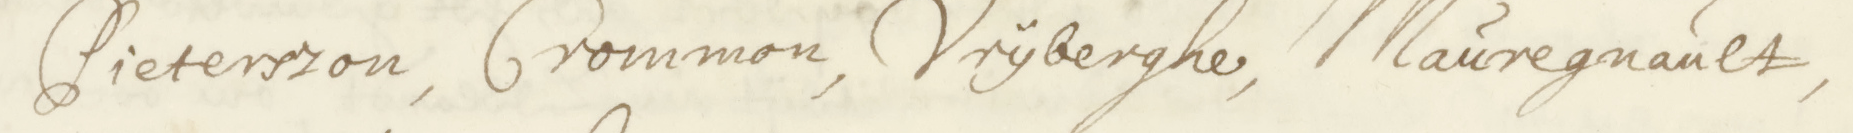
Pieterszon, Crommon, Vrijberghe, Mauregnault,
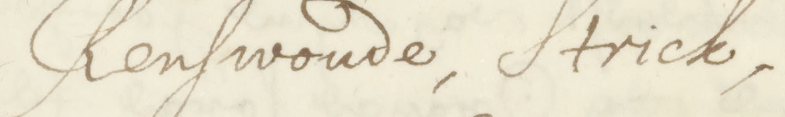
Renswoude, Strick,
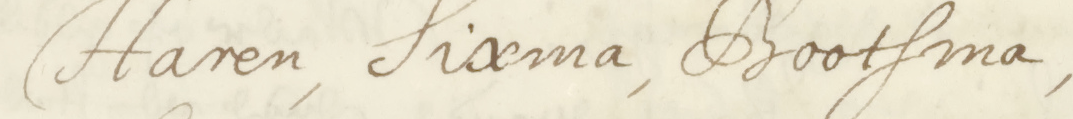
Haren, Sixma, Bootsma,
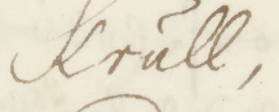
Krull,
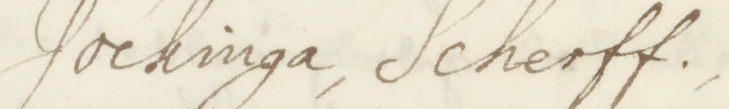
Gockinga, Scherff.
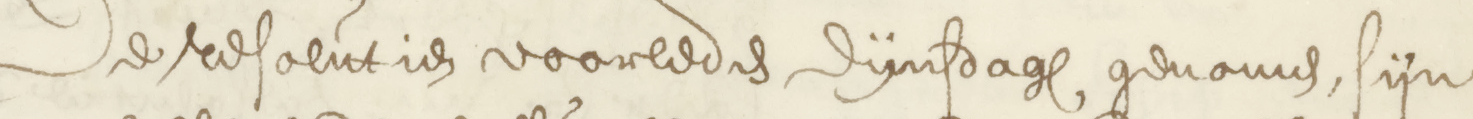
De resolutien voorleden Dijnsdagh genomen, sijn
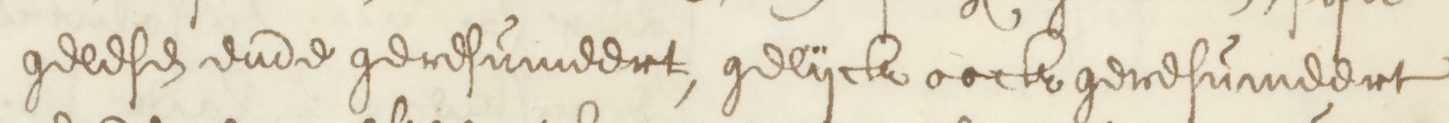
gelesen ende geresumeert, gelijck oock geresumeert
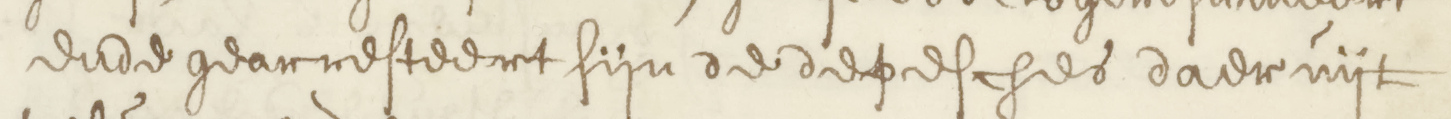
ende gearresteert sijn de depesches daer uijt
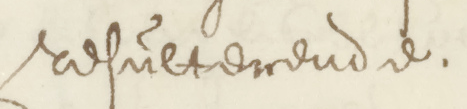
resulterende.
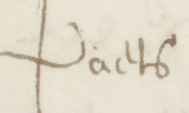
Paets
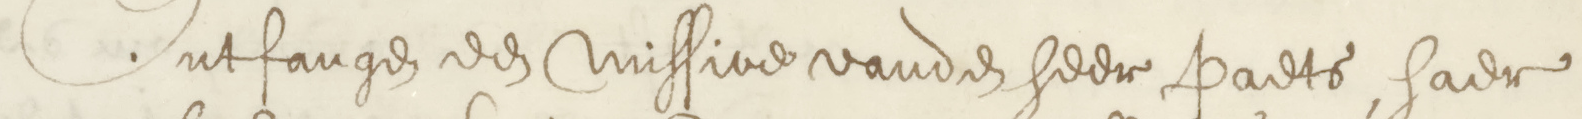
Ontfangen een missive vanden heer Paets, haer
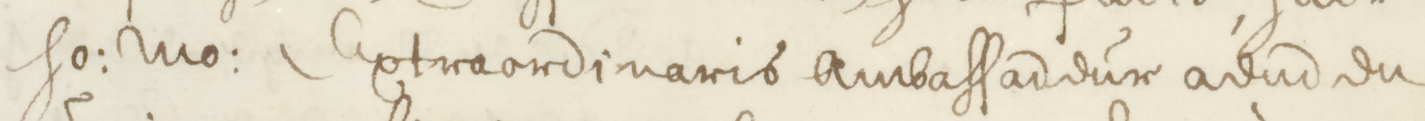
ho:Mo: Extraordinaris Ambassadeur aenden
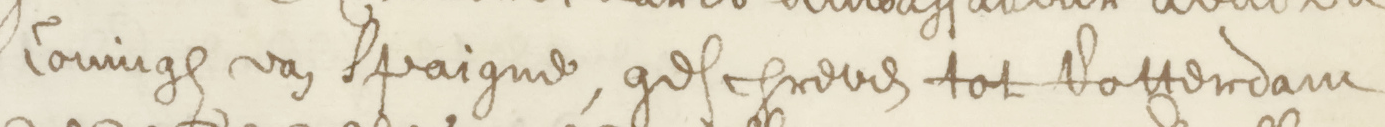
Coningh van Spaigne, geschreven tot Rotterdam
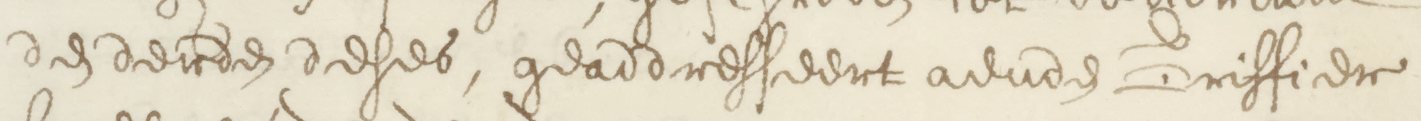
den derden deses, geaddresseert aenden Griffier
